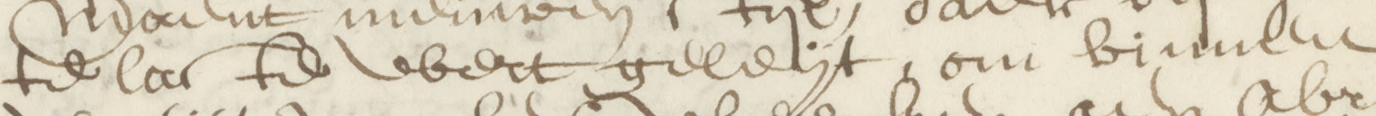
te laste wert geleijt, om binnen
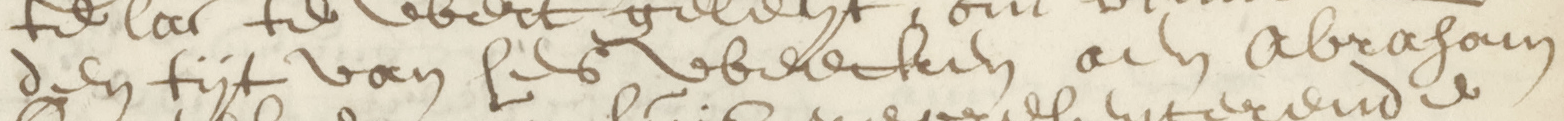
den tijt van ses weecken aen Abraham
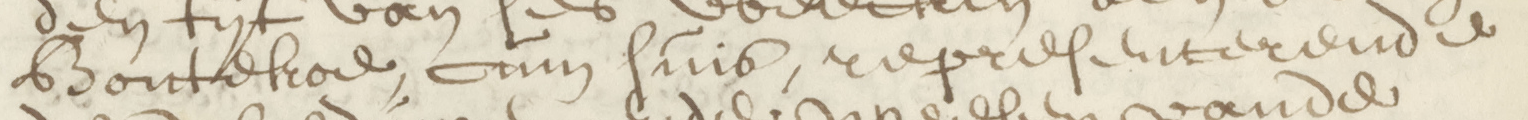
Bontekoe, cum sius, representerende
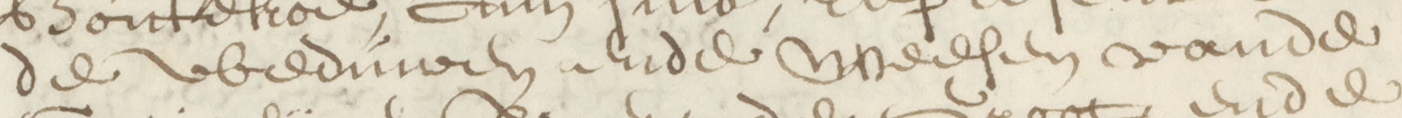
de weduwen ende Weesen vande
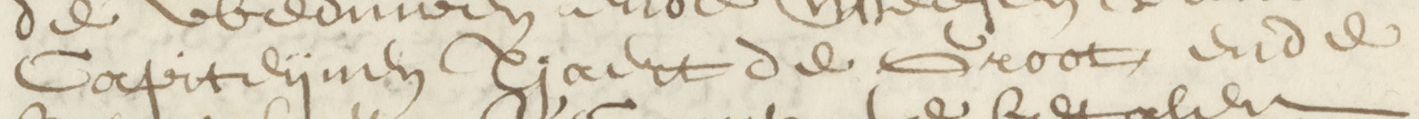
Capiteijnen Tjaert de Groot, ende
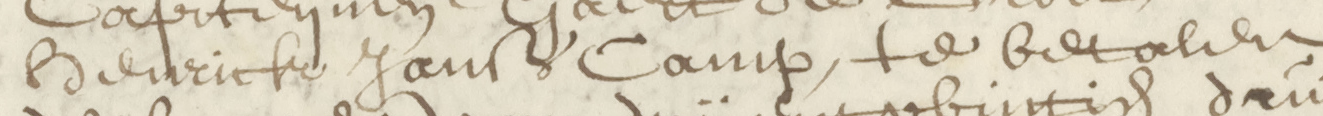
Henrick Jans Camp, te betalen
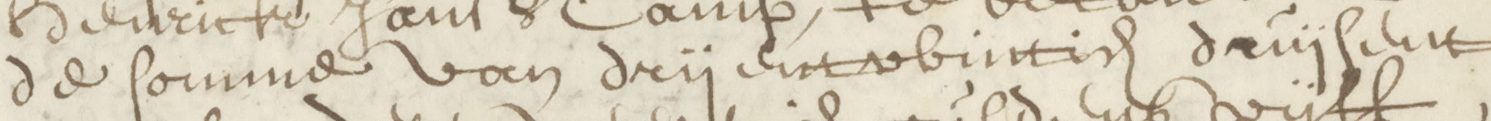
de somme van drijentwintich druijsent
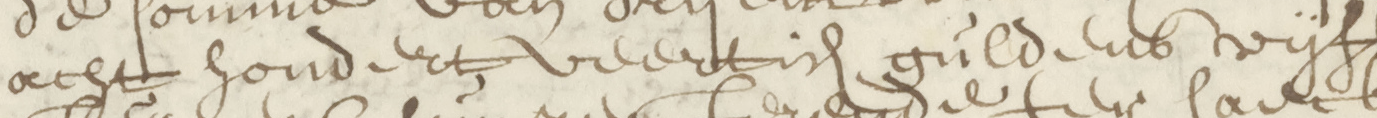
acht hondert veertich guldens vijf
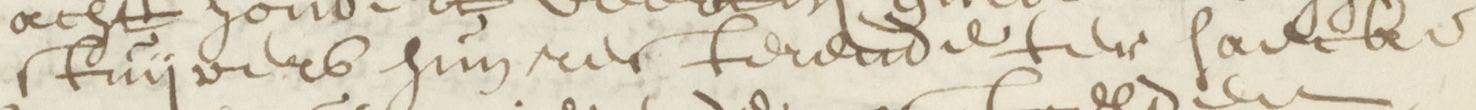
stuijvers hun resterende ter saecken
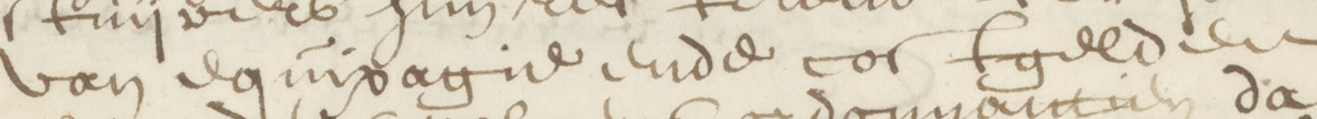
van equipagie ende costgelden
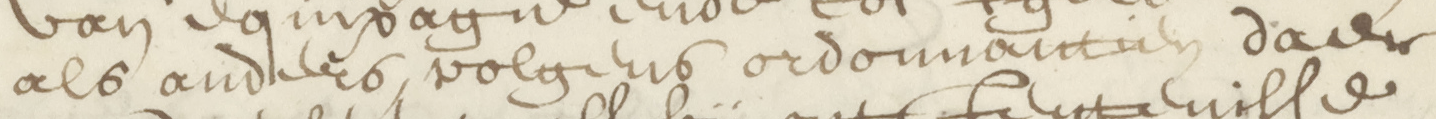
als anders volgens ordonnantien daer
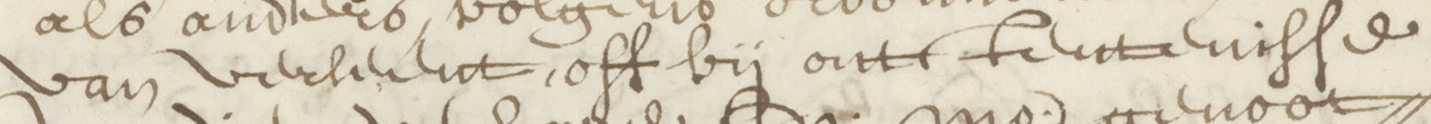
van verleent, oft bij ontstentenisse
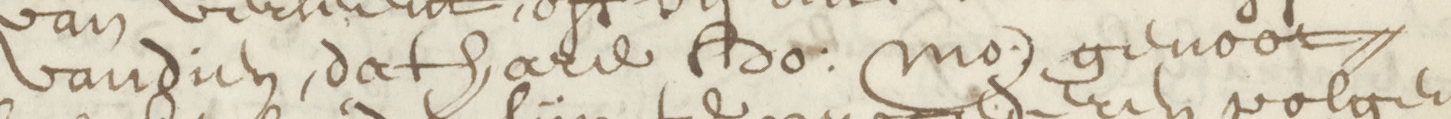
vandien, dat hare ho:Mo: genoot,,
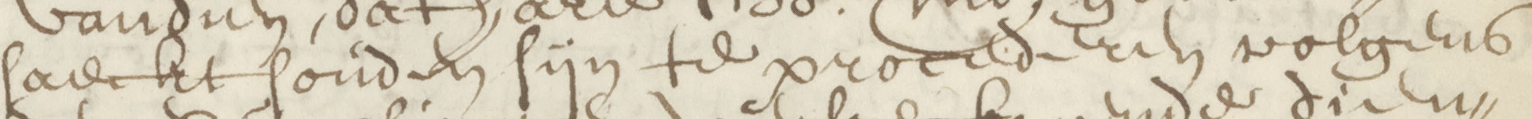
saeckt souden sijn te procederen volgens
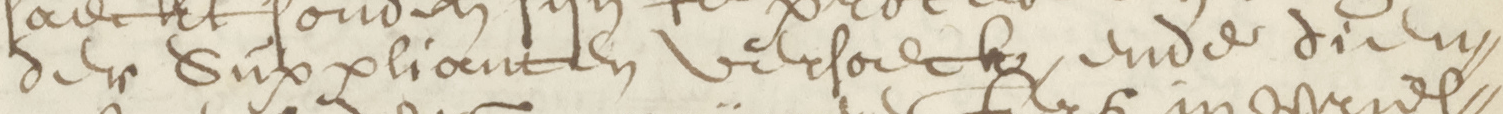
der Supplianten versoeck, ende dien„
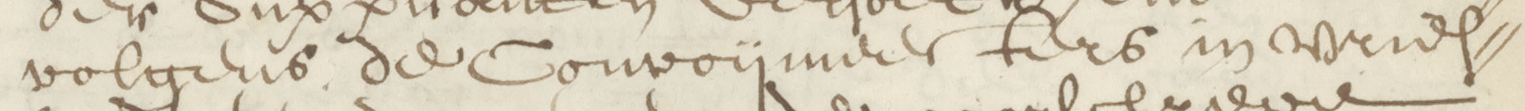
volgens de Convoijmeesters in Vries„
